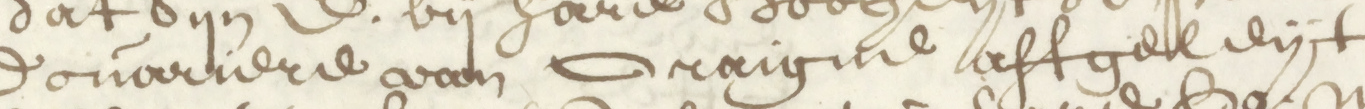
Douariere van Oraigne affgeleijt
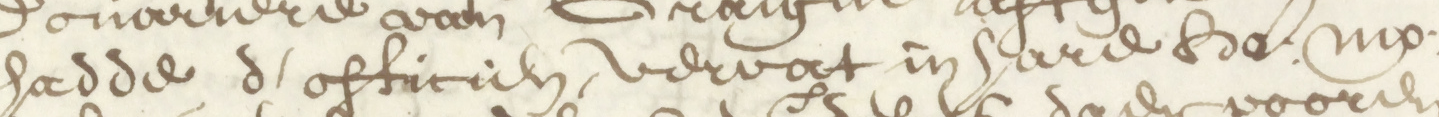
hadde, d'officien, vervat in hare Ho:Mo:
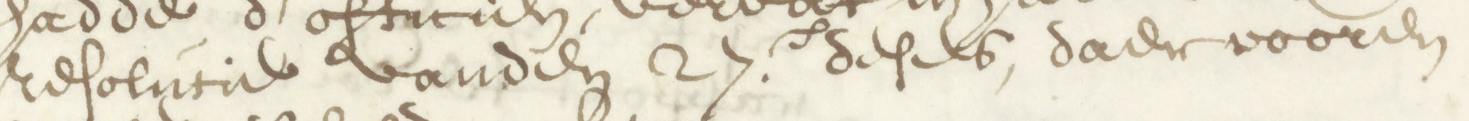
resolutie vande 27en. deses, daervooren
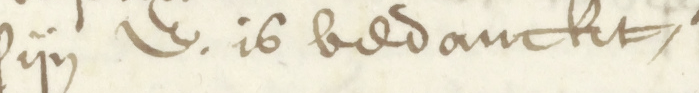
sijn E. is bedanckt.
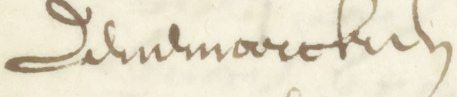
Denemarcken
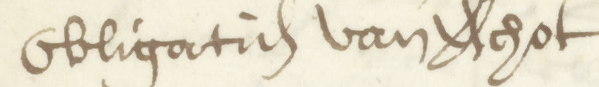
Obligatien van vschot
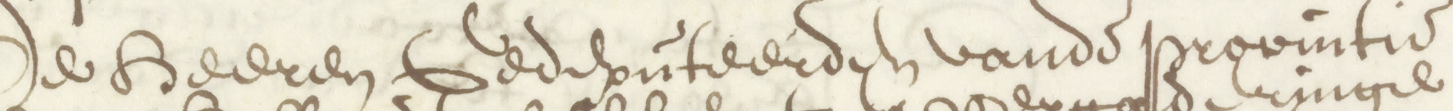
De Heeren Gedeputeerden vande Provintie
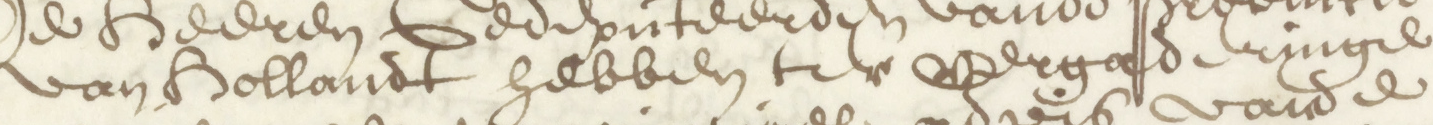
van Hollandt hebben ter Vergaderinge
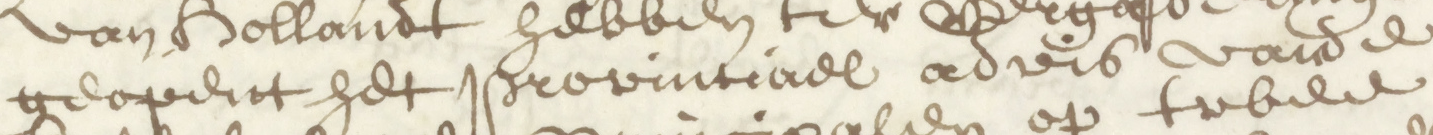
geopent het Provintiael advis vande
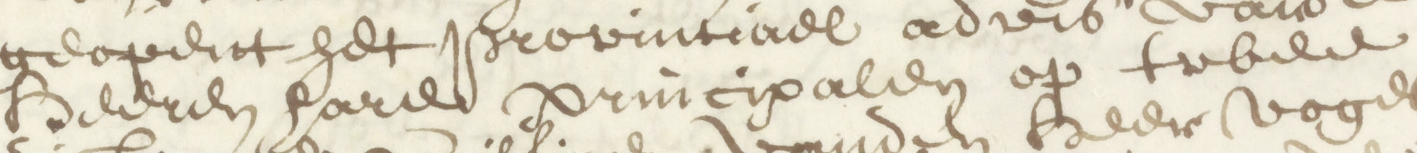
Heeren hare principalen op twee
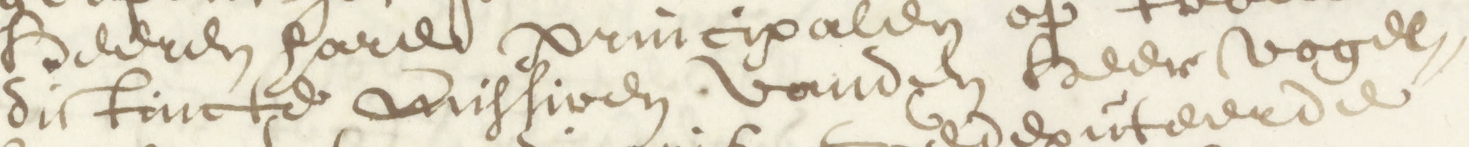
distincte Missiven vanden Heer Vogel„
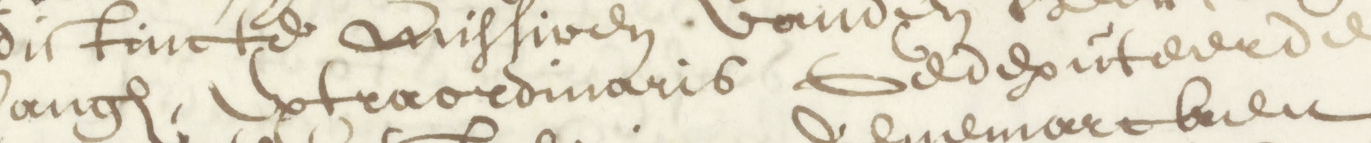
sangh, Extraordinaris Gedeputeerde
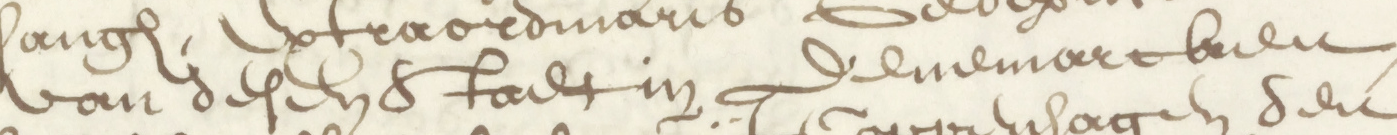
van desen Staet in Denemarcken,
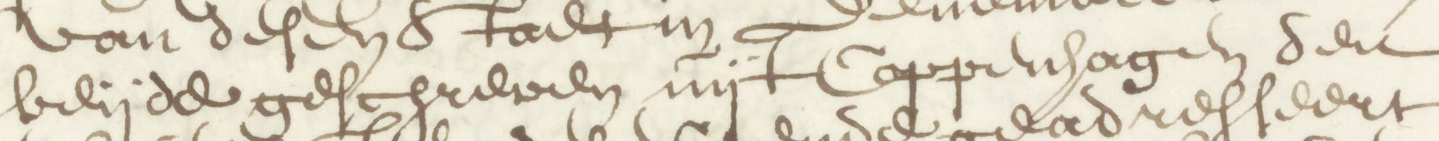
beijde geschreven uijt Coppenhagen den
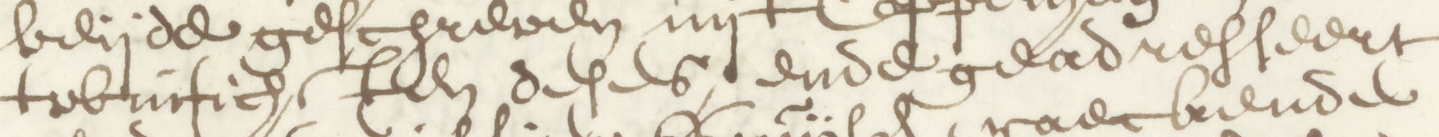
twintichsten deses, ende geadresseert
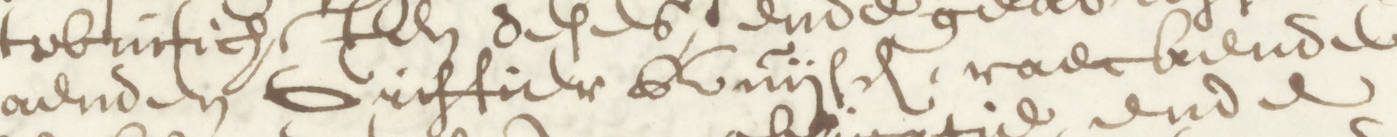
aenden Griffier Ruijsch, raeckende
